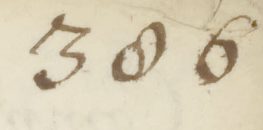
386
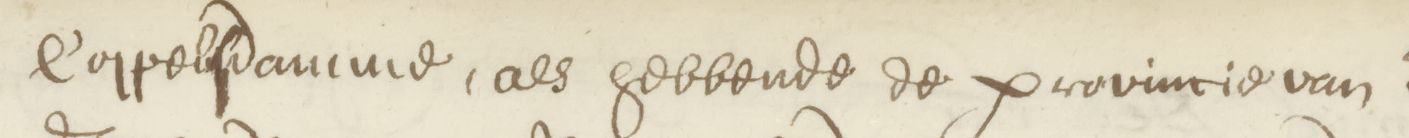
coppelsdamme, als hebbende de provincie van
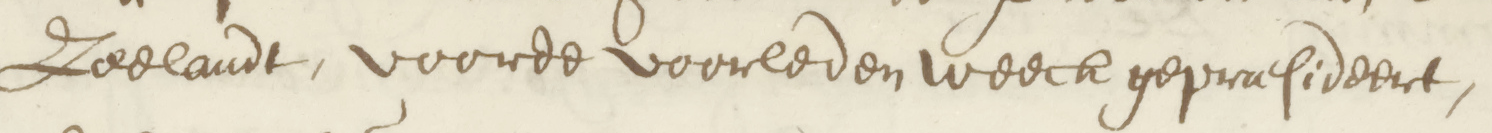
Zeelandt, voorde voorleden weeck gepresideert.
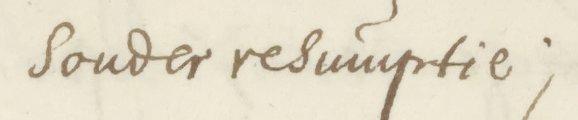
sonder resumptie.
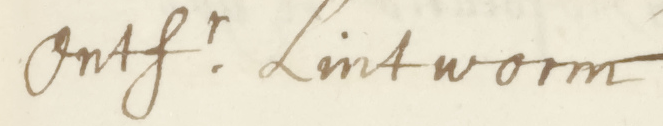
ontfr. Lintworm
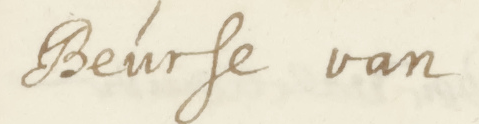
Beurse van
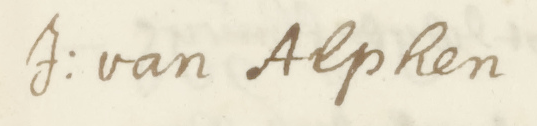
J: van Alphen
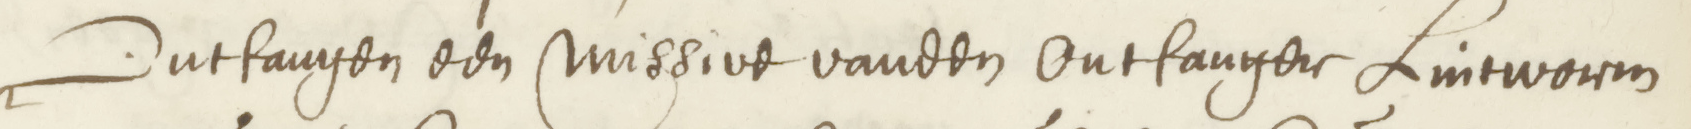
Ontfangen een missive vanden Ontfanger Lintworm
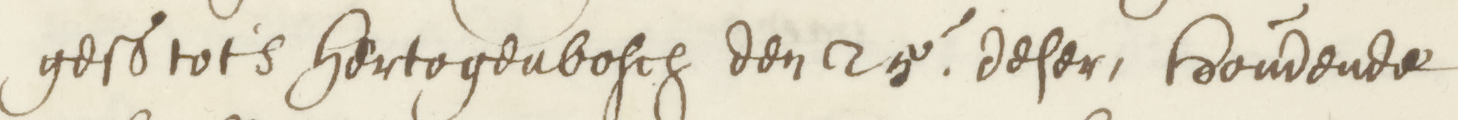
gess tot ‛s hertogenbosch den 25e. deser, houdende
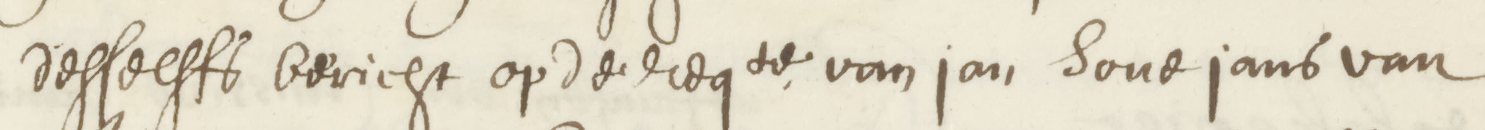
desselffs bericht op de reqte. van jan sone jans van
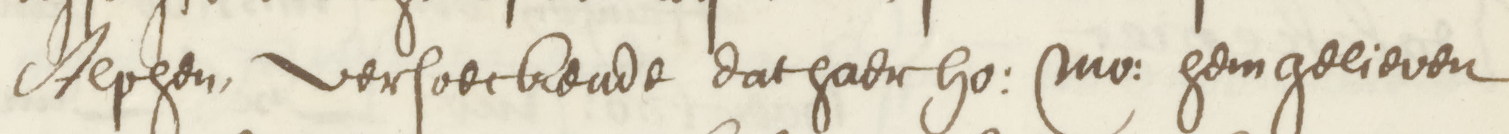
Alphen, versoeckende dat haer ho:mo: hem gelieven
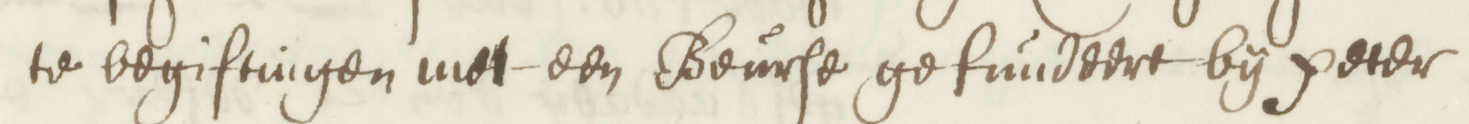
te begiftingen met een Beurse gefundeert bij peter
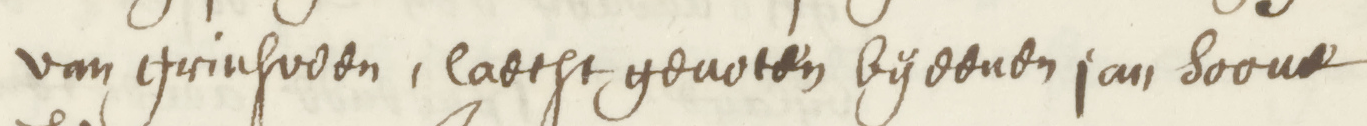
van grinsveen, laetst genoten bij eenen jan soone
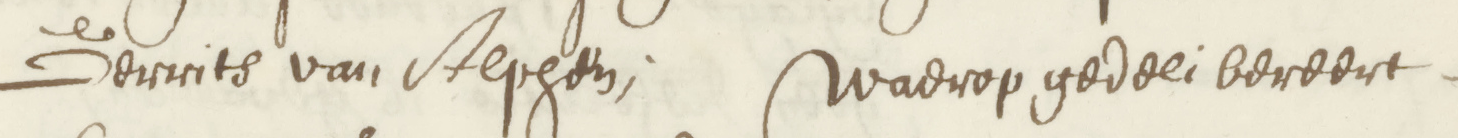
Gerrits van Alphen: Waerop gedelibereert
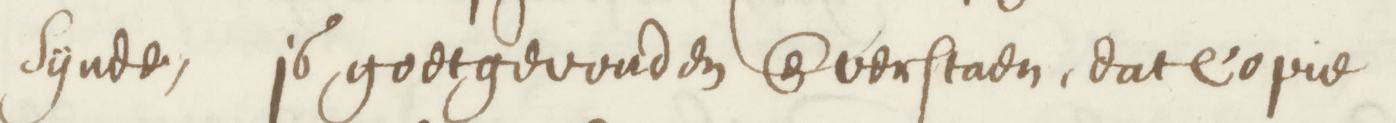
sijnde, is goetgevonden & verstaen, dat copie
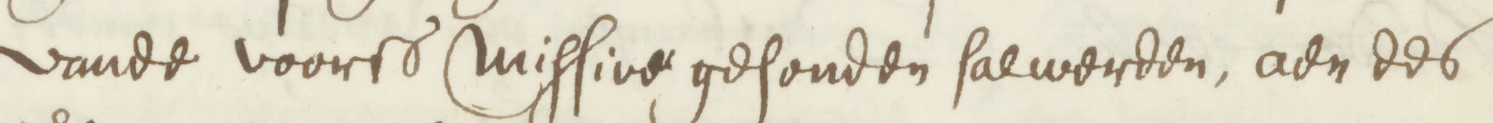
vande voors missive gesonden sal werden, aen des
